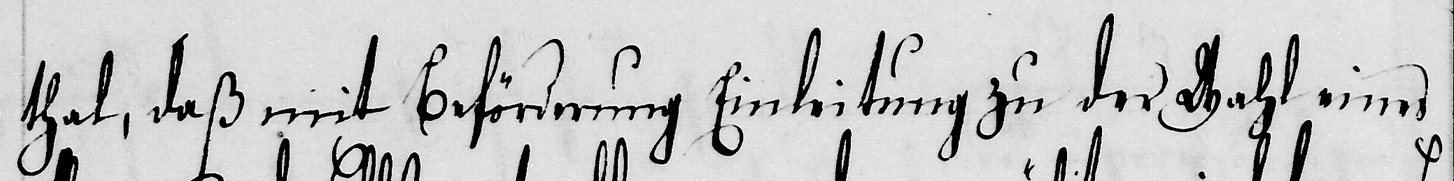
thal, daß mit Beförderung Einleitung zu der Wahl eines
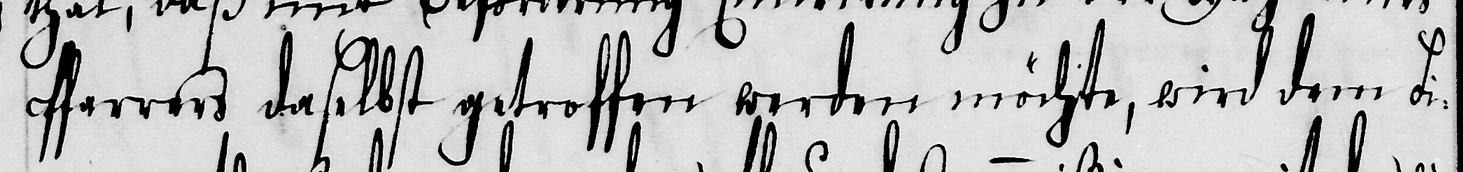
Pfarrers daselbst getroffen werden möchte, wird dem Fi¬
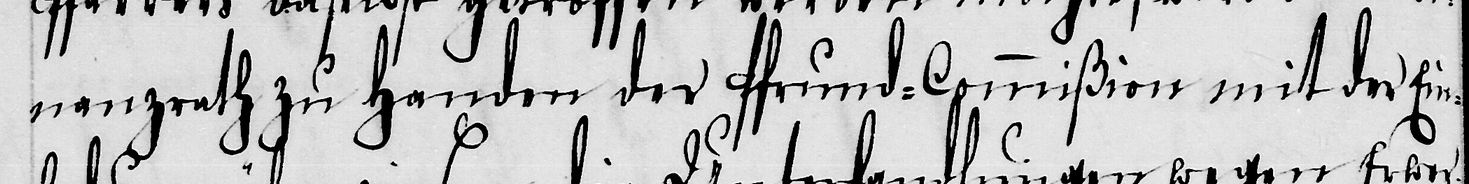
nanzrath zu Handen der Pfrund-Commißion mit der Ei¬
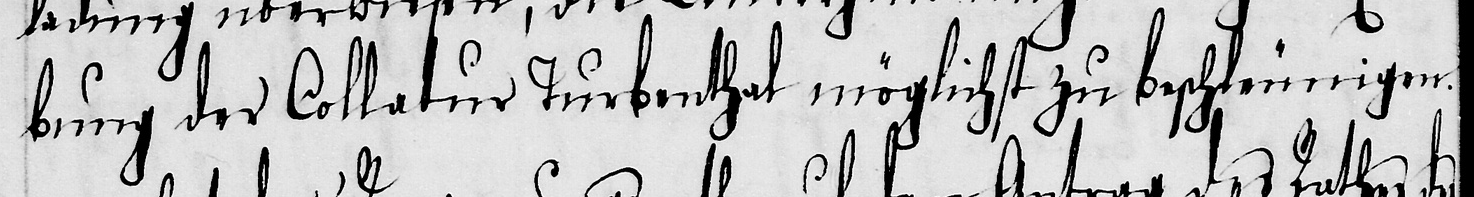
bung der Collatur Turbenthal möglichst zu bschleunigen.
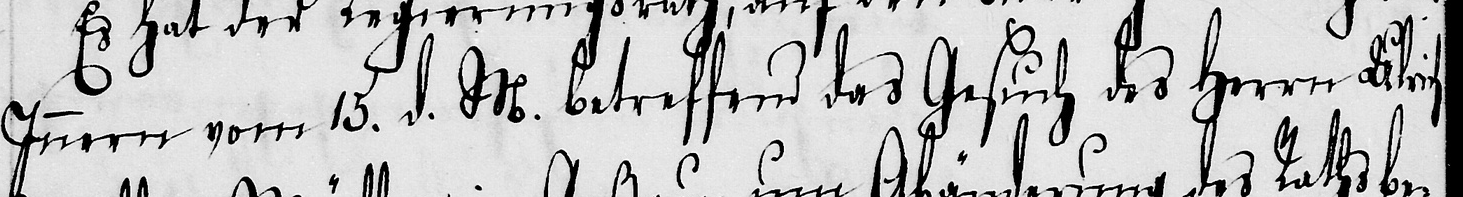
Innern vom 15. d. M. betreffend das Gesuch des Herrn Ul¬
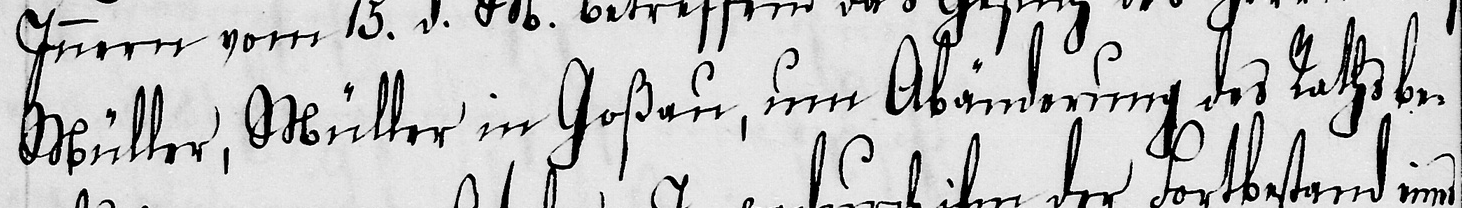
Müller, Müller in Goßau, um Abänderung des Rathsbes¬
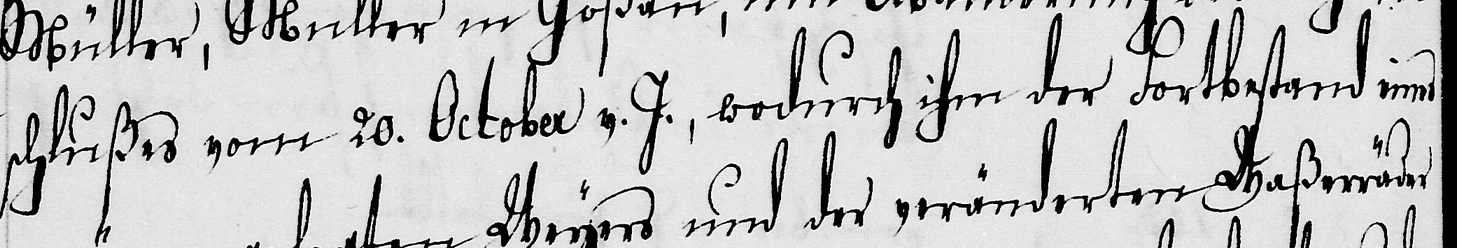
chlußes vom 20. October v. J., wodurch ihm der Fortbestand e¬
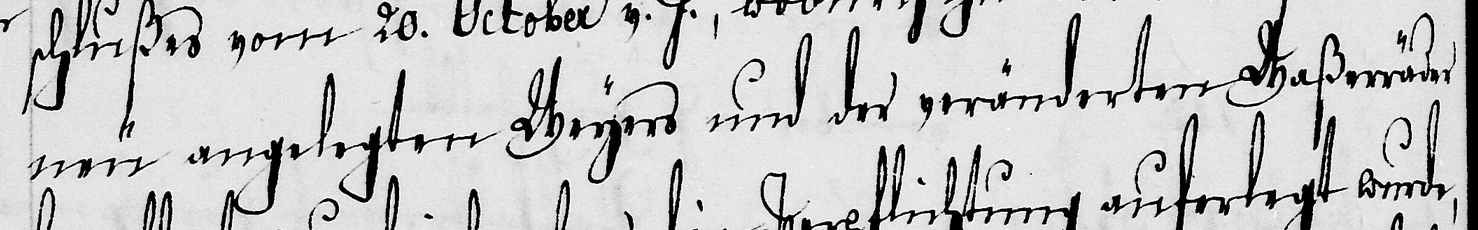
neu angelegten Weyers und der veränderten Waßerräd¬
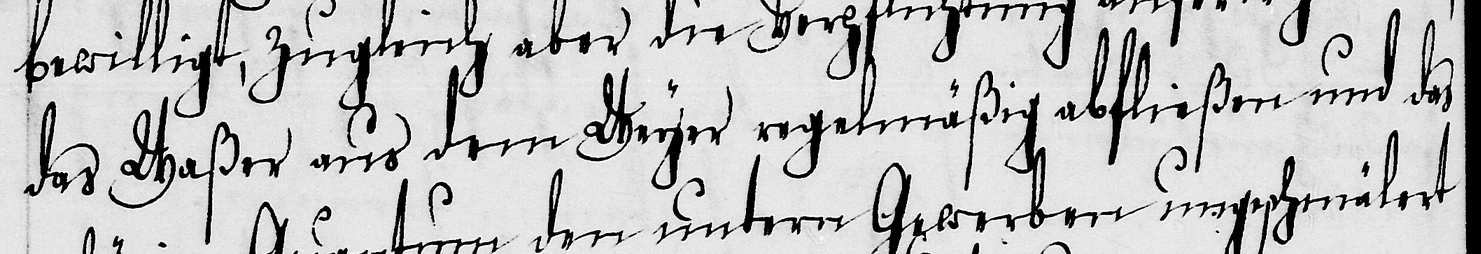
das Waßer aus dem Weyer regelmäßig abfließen und das
